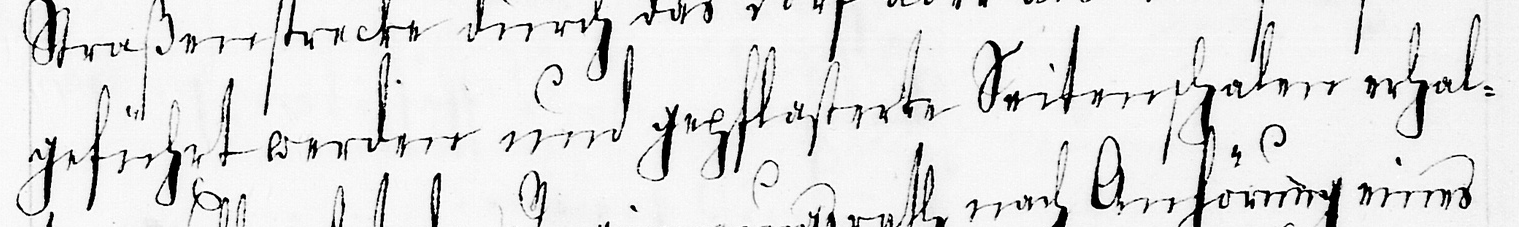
geführt werden und gepflasterte Seitenschalen erhal¬
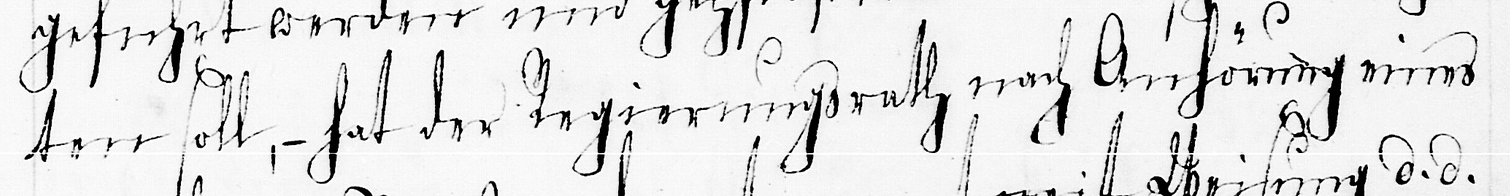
ten soll, – hat der Regierungsrath nach Anhörung eines
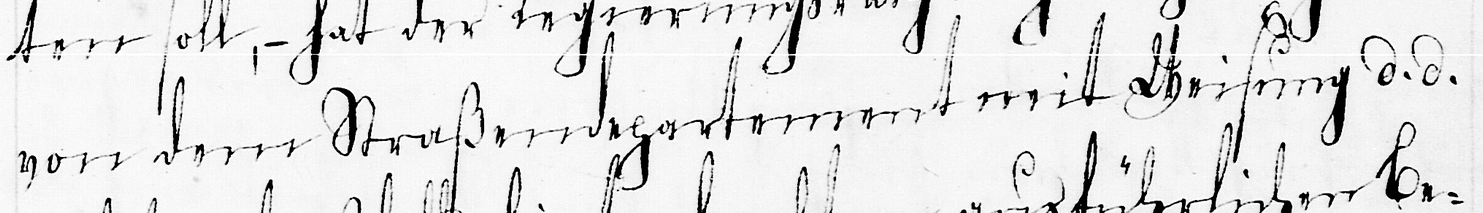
von dem Straßendepartement mit Weisung d. d.
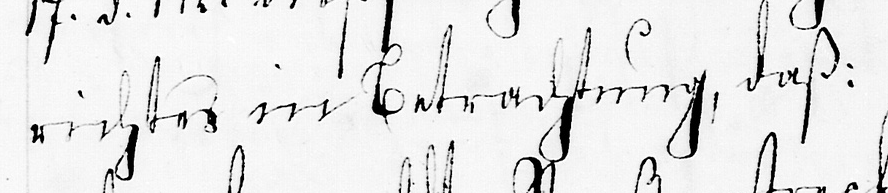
richtes in Betrachtung, daß:
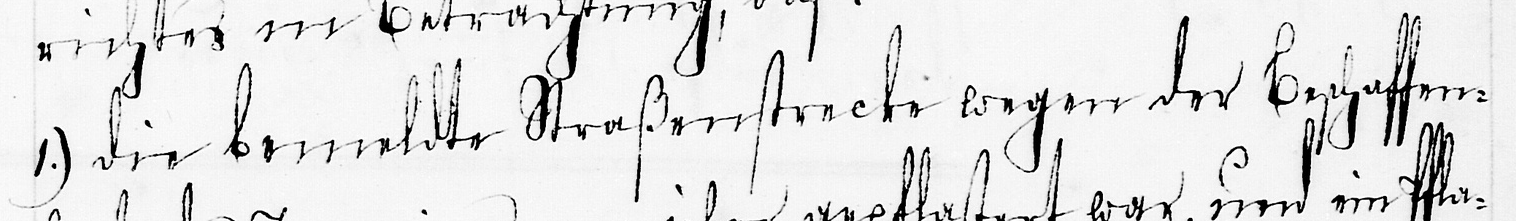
1.) Die bemeldte Straßenstrecke wegen der Beschaffen¬
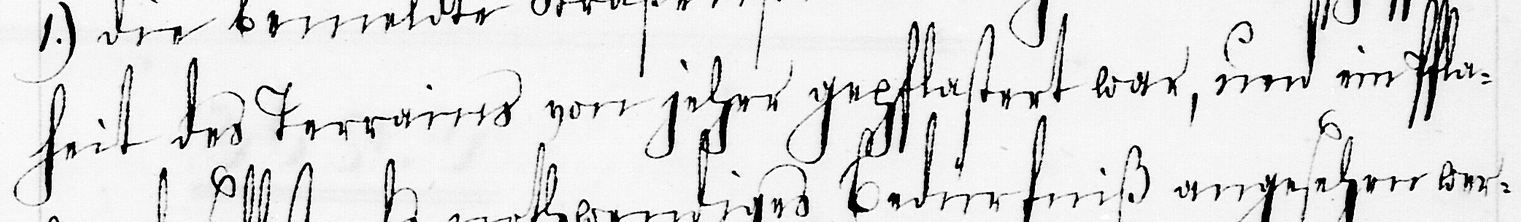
heit des Terrains von jeher gepflastert war, und im Pfla¬
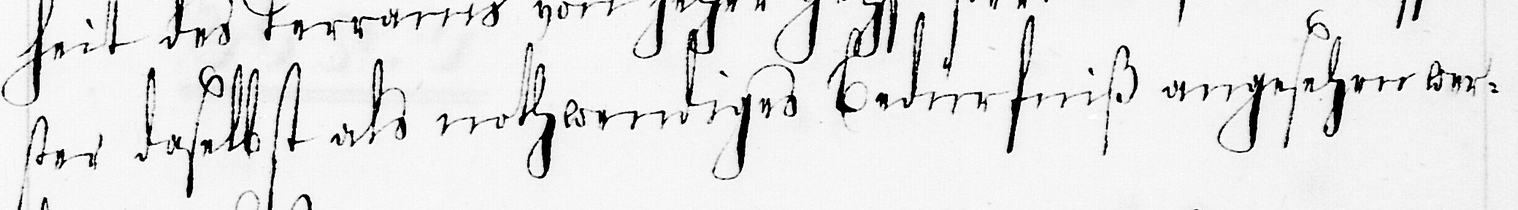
ster daselbst als nothwendiges Bedürfniß angesehen wer¬
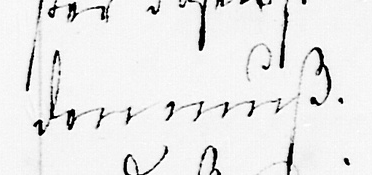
den muß.
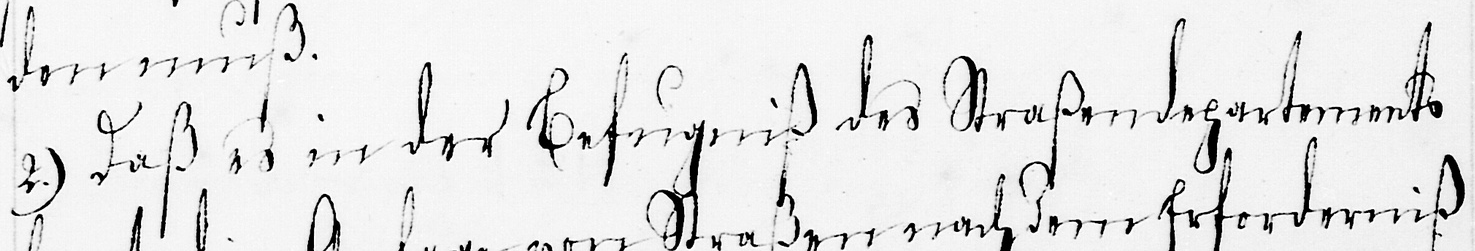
2.) Daß es in der Befugniß des Straßendepartements
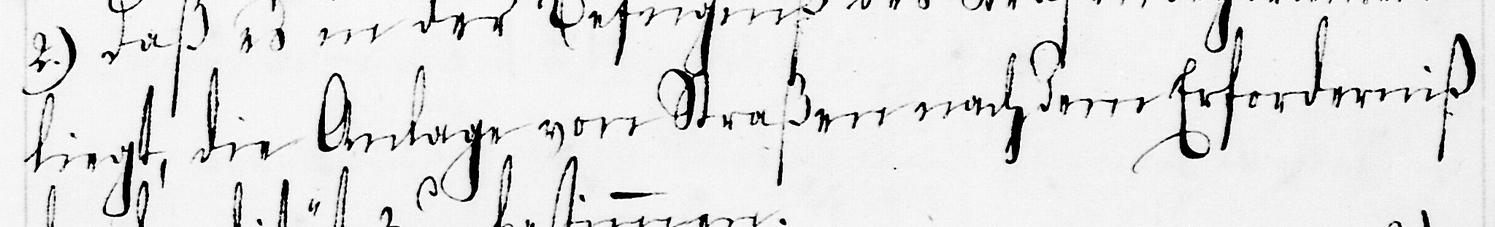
liegt, die Anlage von Straßen nach dem Erforderniß
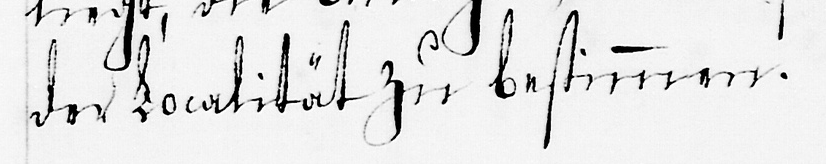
der Localität zu bestimmen.
